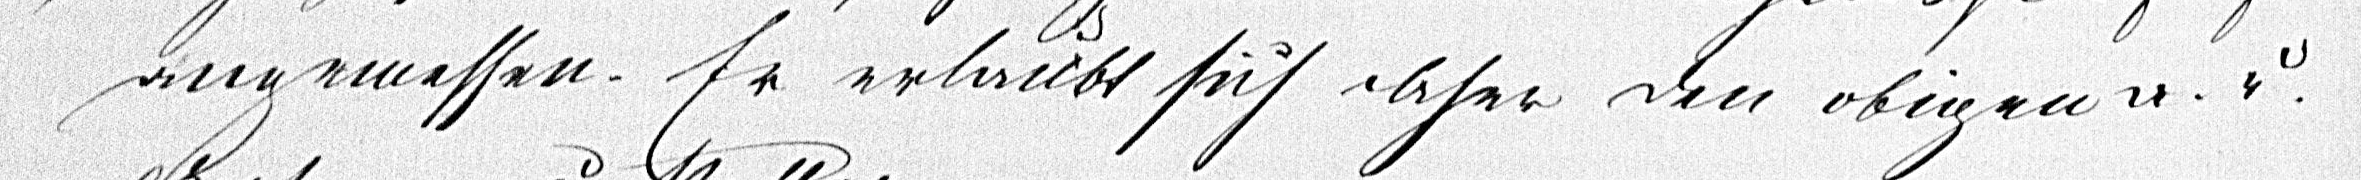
angemessen. Er erlaubt sich xxher den obigen a. u.
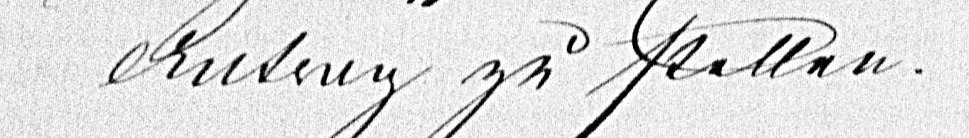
Antrag zu stellen.
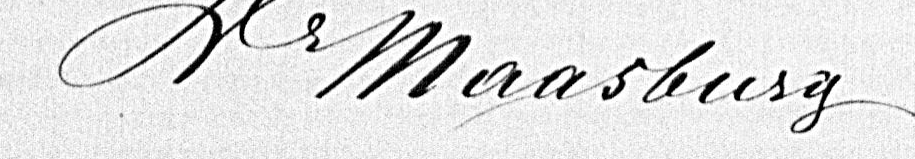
Dr Maasburg
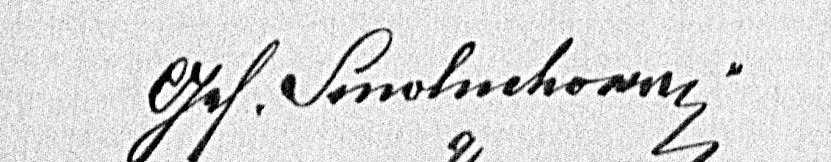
Ges. Smolxx
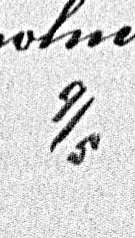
9/5
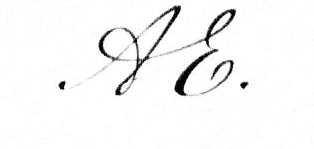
AE.
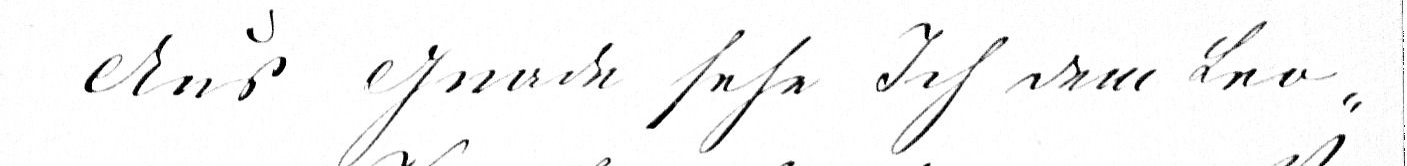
Aus Gnade sehe Ich dem Leo¬
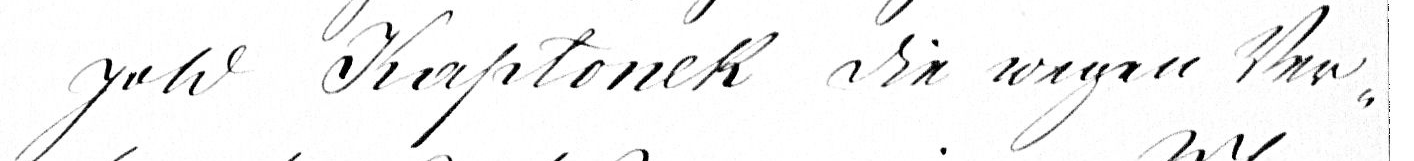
pold Kaptonek die wegen Ver¬
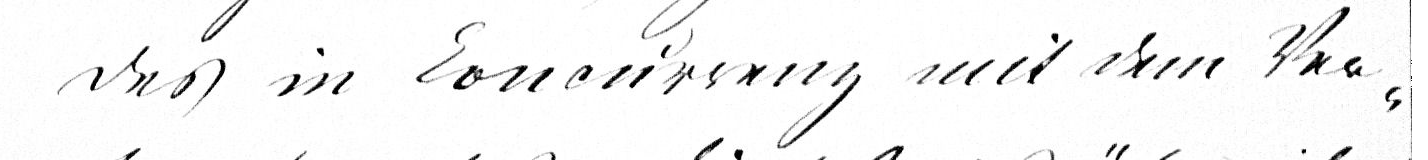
des in Concurrenz mit dem Ver¬
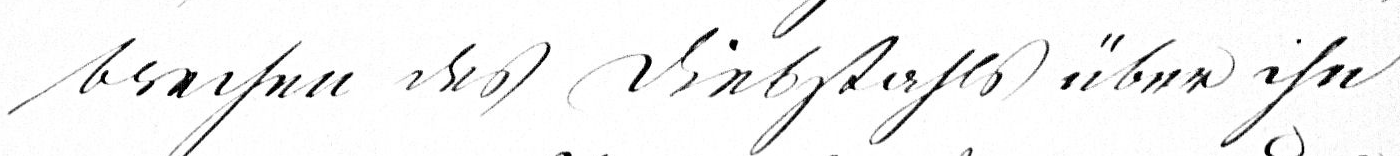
brechen des Diebstahls über ihn
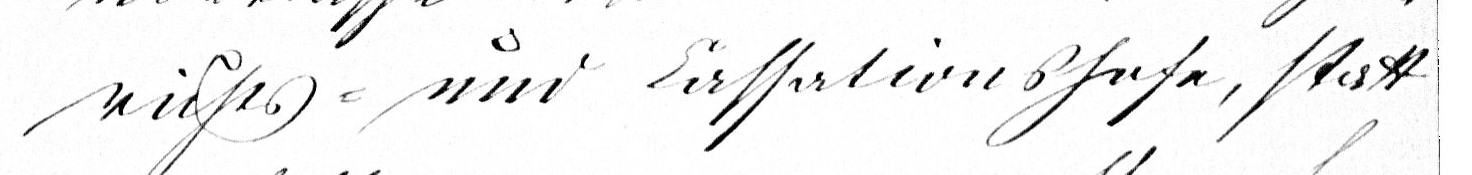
richts - und Cassationshofe, statt
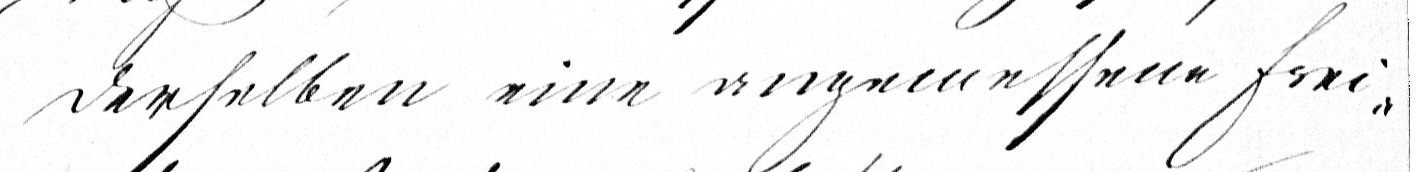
derselben eine angemessene Frei¬
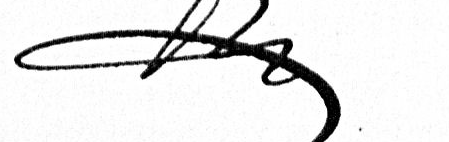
xx
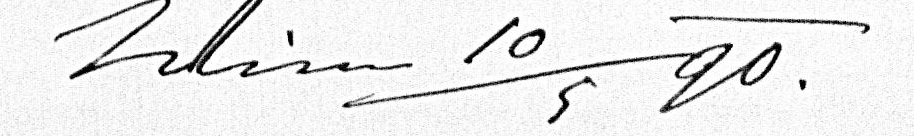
Wien 10/5 90.
